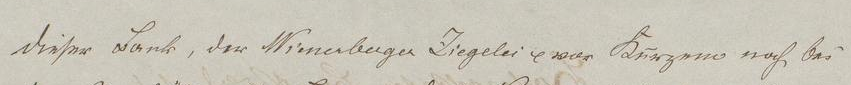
dieser Bank, der Wienerberger Ziegelei & vor Kurzem noch bei
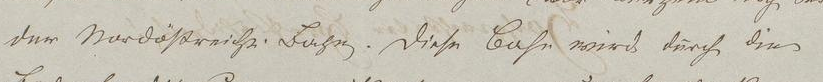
der Nordöstreichn. Bahn. Diese Bahn wird durch die
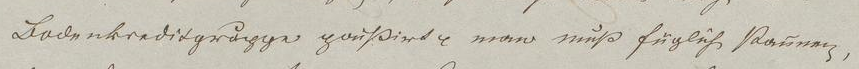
Bodenkreditgruppe poußirt & man muß füglich staunen,
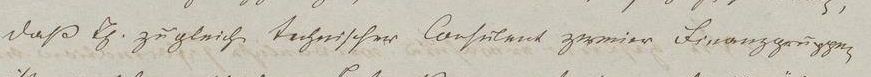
daß Th. zugleich technischer Consulent zweier Finazgruppen
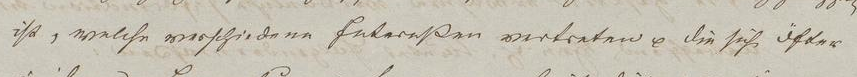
ist, welche verschiedene Intereßen vertreten & die sich öfter
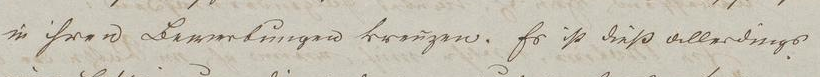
in ihren Bewerbungen kreuzen. Es ist dieß allerdings
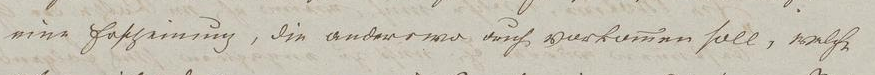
eine Erscheinung, die anderswo auch vorkommen soll, welche
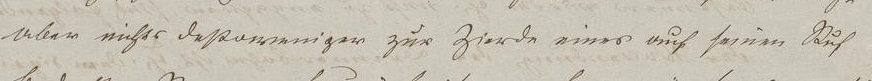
aber nichts destoweniger zur Zierde eines auf seinen Ruf
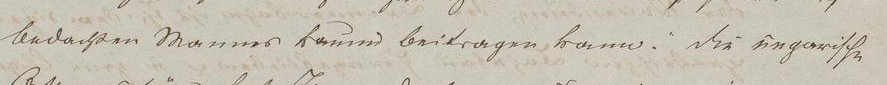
bedachten Mannes kaum beitragen kann. Die ungarische
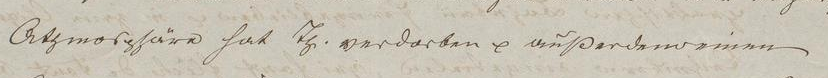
Athmosphäre hat Th. verdorben & außerdem einen
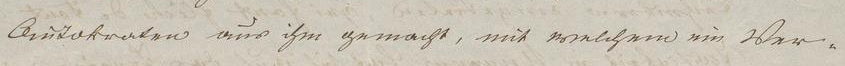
Autokraten aus ihm gemacht, mit welchem ein Ver-
